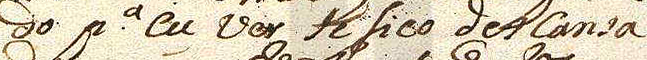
do p.a eu ver se fico descansa
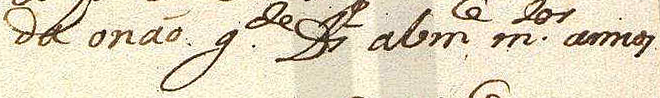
da o naõ. g.de Ds̄ a Vmce m.tos annos
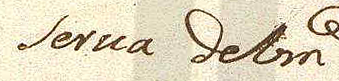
Serua de Vmce
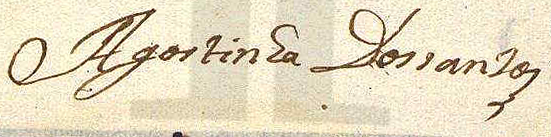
Agostinha Dos santos
